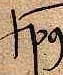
tp̄ꝯ
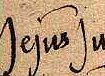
Jejūs Ju
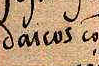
daicos cō
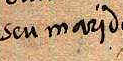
seu marjdo.
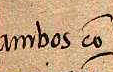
ambos cō
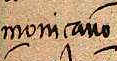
monicauō
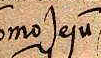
cōmo Jejū
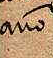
auō
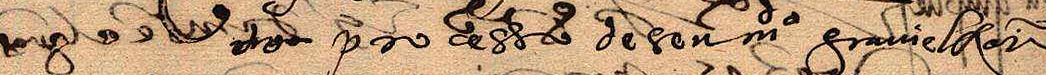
do processo de seu mo grauiel Roiz̄
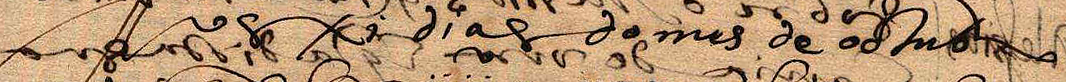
Aos xi dias do mes de octubro
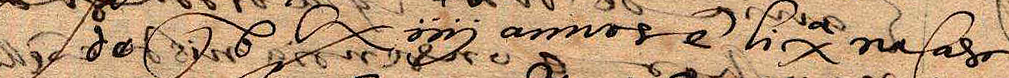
de j̄ b lxiiij annos ē lixa na Casa
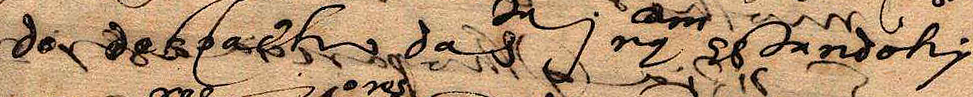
do despacho da Sta Jnqcam Estando hy
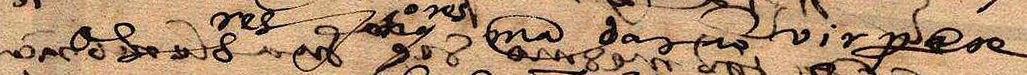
os sres Jnqores mādaraõ vir ꝑāte
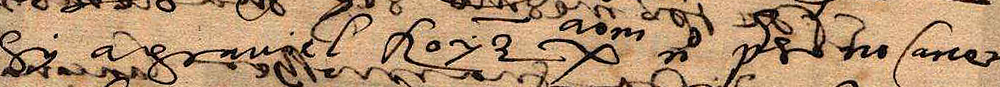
sy a grauiel Royz̄ xaom no p̄so no Carcer
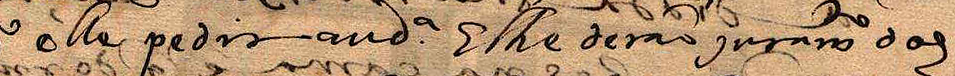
p̄o elle pedir aud.a E lhe deraõ juramto dos
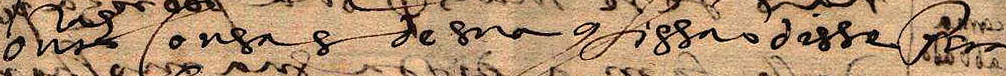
outras Cousas de sua ꝯfissão disse q̄ era
